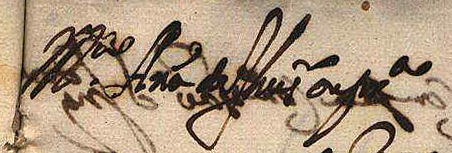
M.a Anā de Jhus̄ ou pra
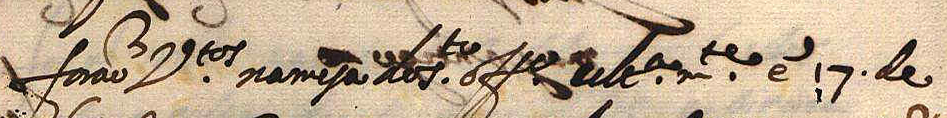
foraõ V.tos na mesa do s.to offo. ult.am.te ē 17. de
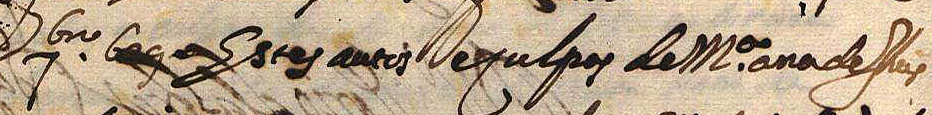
7bro. 629 Estes autos e Culpas de M.a ana de Jhus
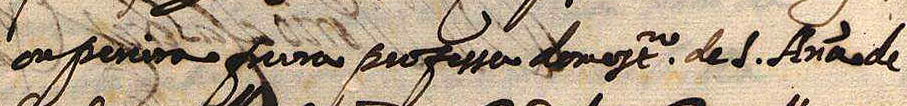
ou pereira freira professa do mostro. de S. Anā de
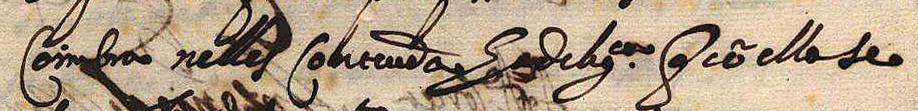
Coimbra nelles Conteuda E a deligca. q̄ cō ella se
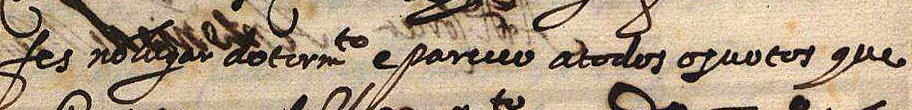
fes no lugar do tormto e pareceo a todos os uotos que
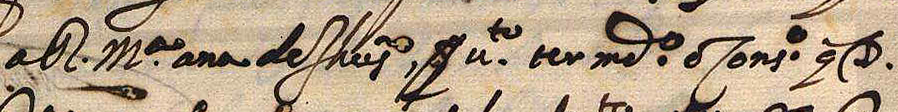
a R. M.a ana de Jhus̄, q u.to ter md.o o Cons.o q̄ D.
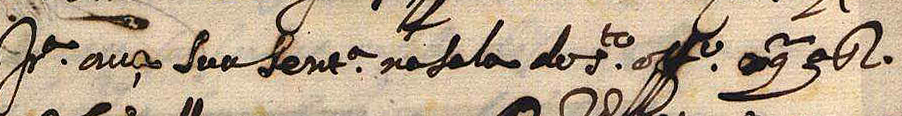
Jra. ouça sua sent.a na sala do s.to offo. e q̄ a R.
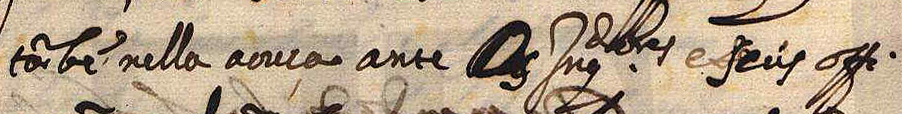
tābē nella a ouça ante Os Jnqdo.res e seus offi
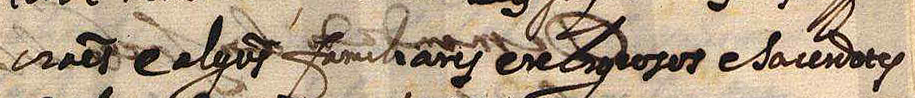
ciaēs e algūs familiares e religiosos e sacerdotes
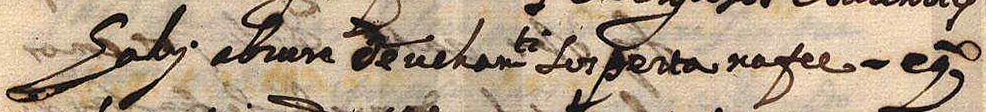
E alj abiure de uehemti sospeita na fee - e q̄
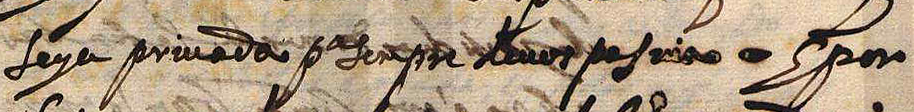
seya priuada pa sempre de uos pasiua - E por
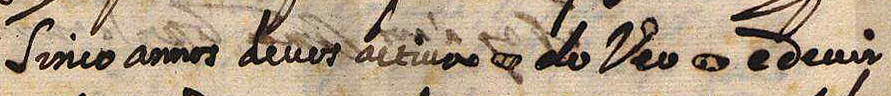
sinco annos de uos actiua e do Veo - e de uir
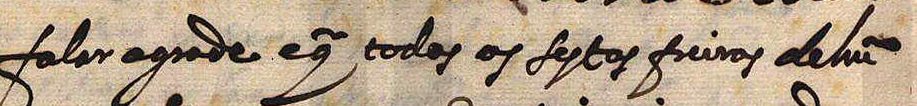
falar a grade e q̄ todas as sestas freiras de hū
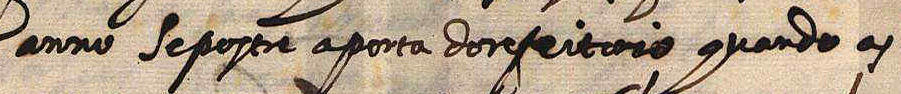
anno se postre a porta do refeitorio quando as
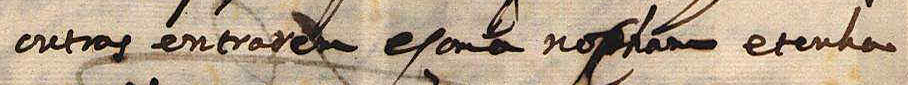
outras entrarem e Coma no Cham e tenha
